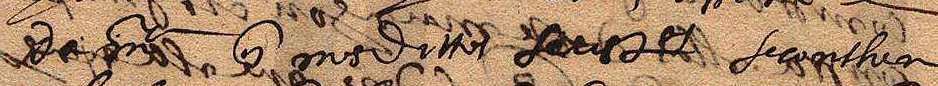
da mra q̄ nos dittos seus tos se conthen
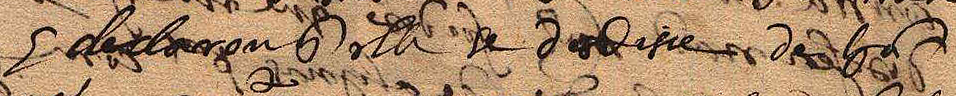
E declarou q̄ elle se desdisse de hū
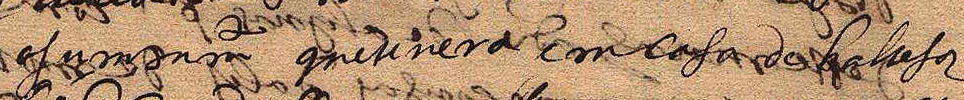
aJumtamto que tiuera em casa de baltesar
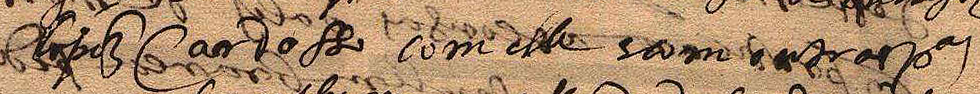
lopez̄ Cardosso com elle E com outras pas
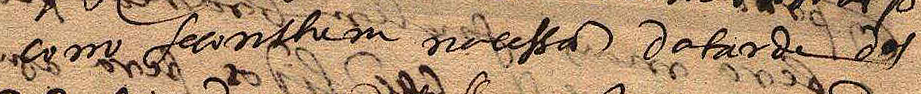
como se conthem na cessaõ da tarde dos
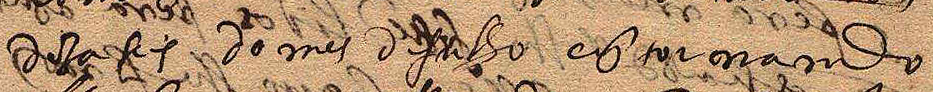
dezaseis do mes de Julho e q̄ tornando
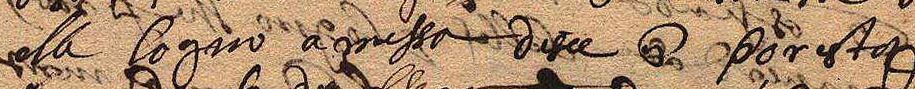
elle loguo a missa disse q̄ por estar
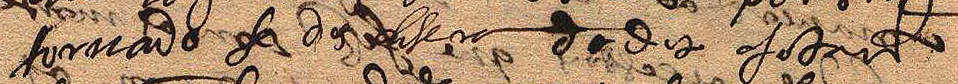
toruado se desdisera do dito aJūtamto
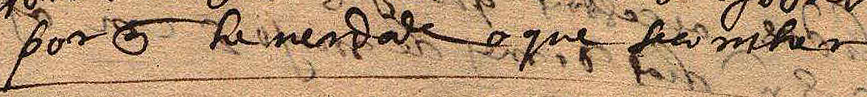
porq̄ he uerdade o que se conthem
